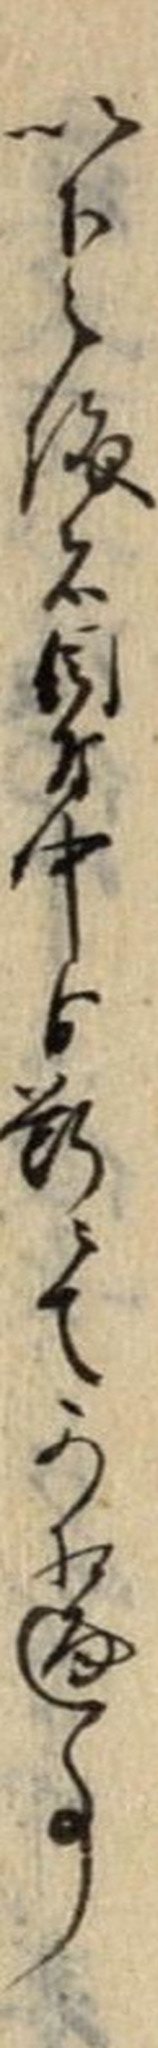以下之儀は目付中ゟ断にて可相通事
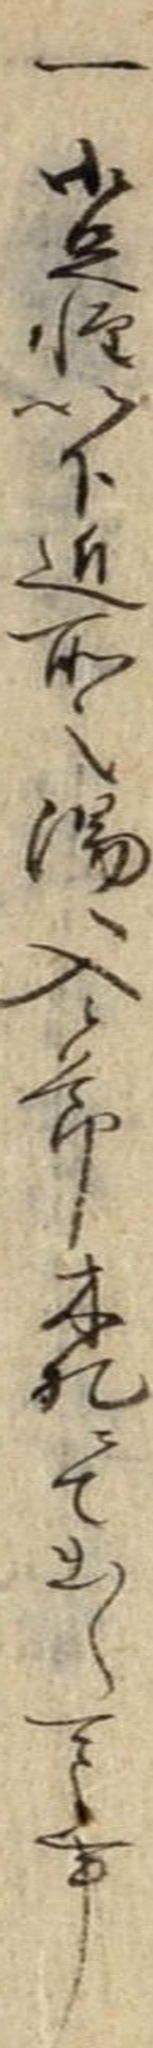一御足軽以下近所之湯へ入候節木札にて出し可申事
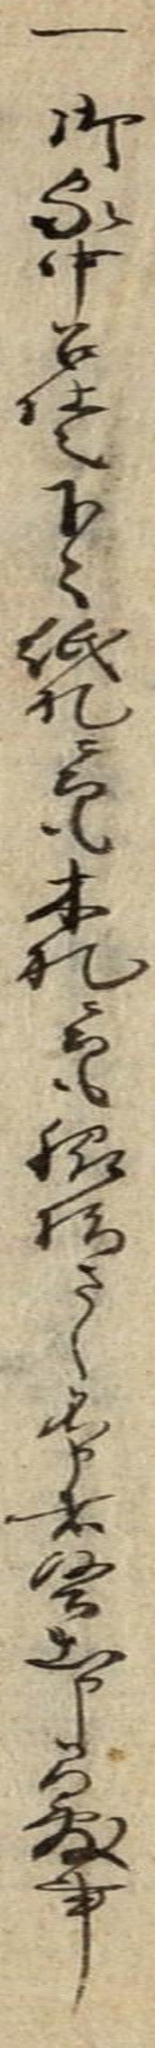一御家中召仕之下々紙札にても木札にても脇指さし不申者堅出申間敷事
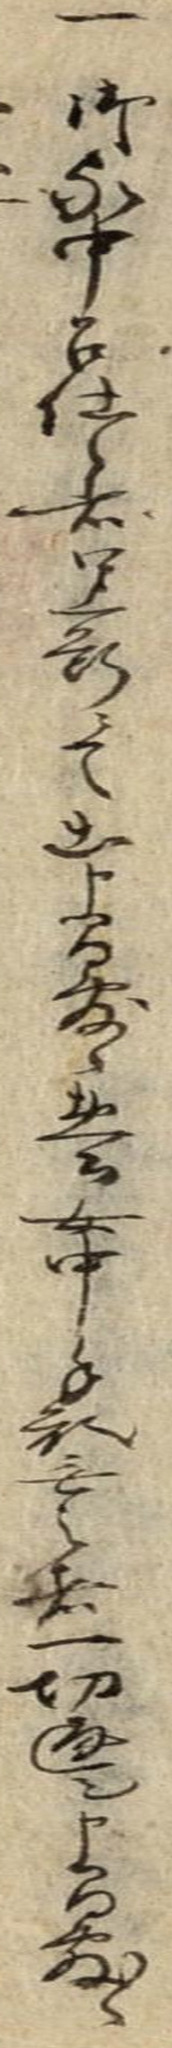一御家中召仕之者口上断にて出申間敷候惣て女中手形無之者一切通し申間敷事
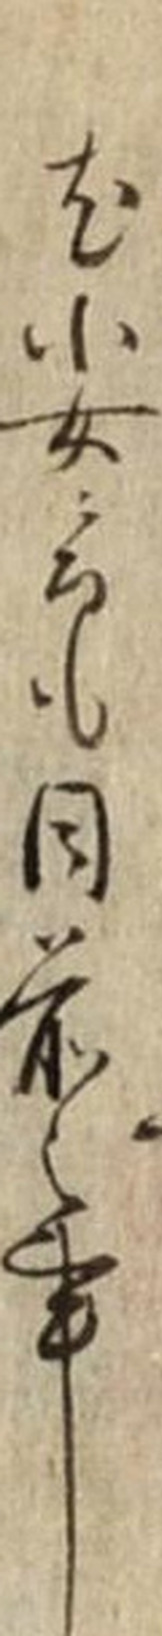尤小女にても同前之事
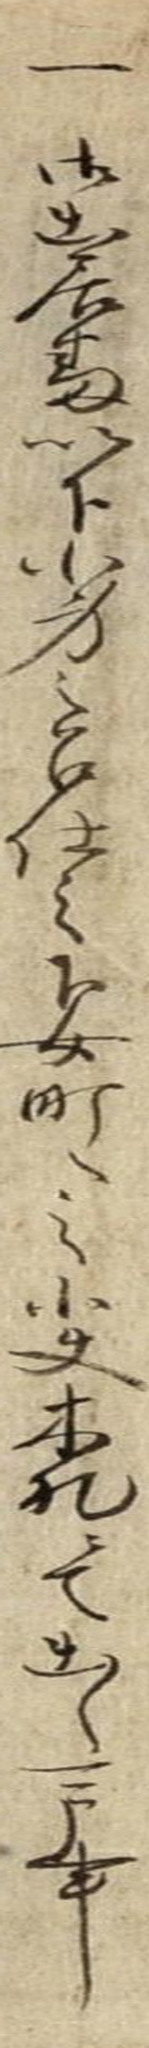一御出居番以下小身之召仕之下女町へ之小使木札にて出し可申事
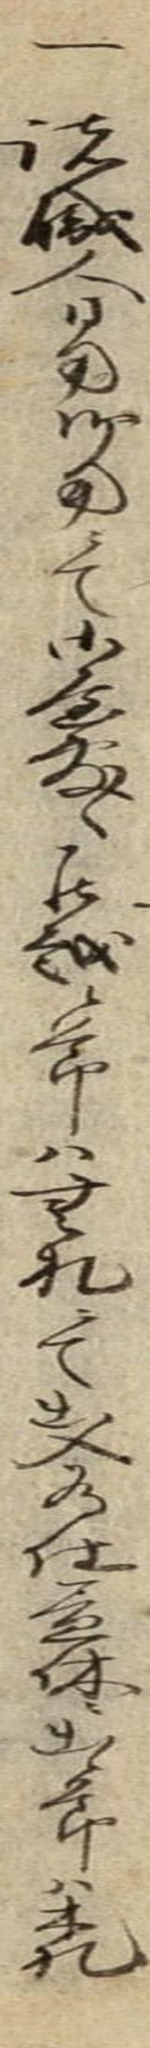一諸職人日用御用にて御屋敷へ罷越候節は無札にて出入為仕昼休に出候節は木札
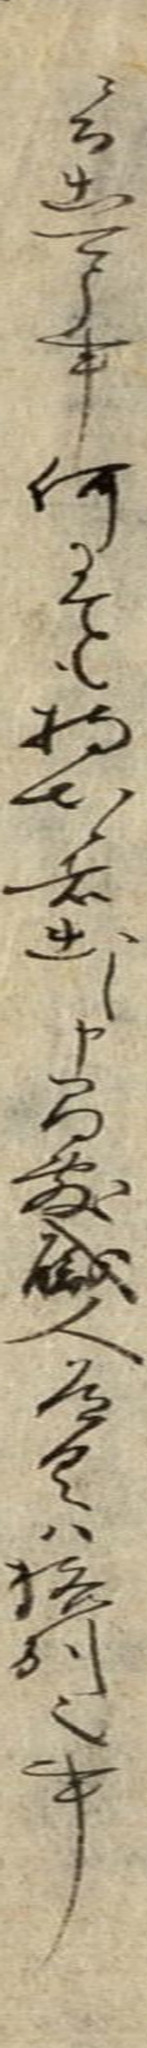にて出可申事何にても持出候者出し申間敷職人道具は格別之事
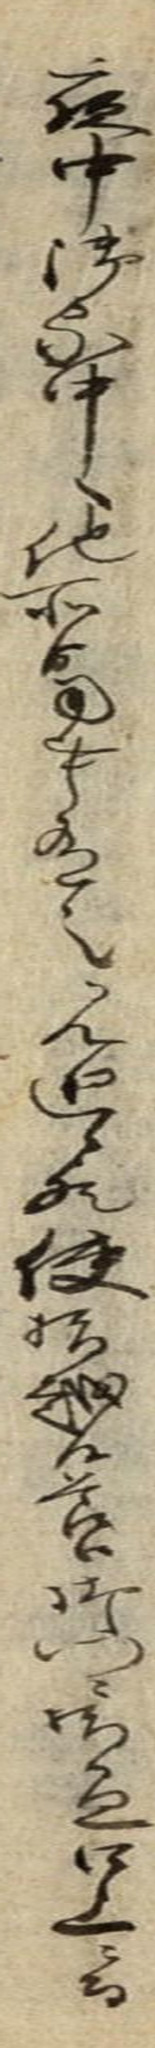一夜中御家中へ他所ゟ用事有之見廻候歟使指越候節は御門に指置口上にて
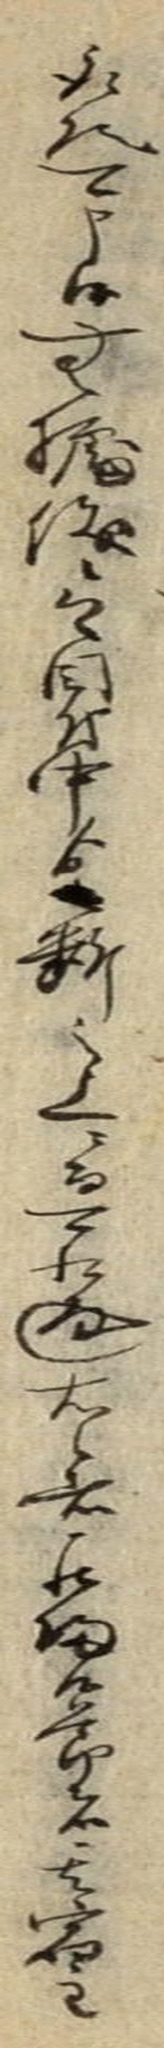取次可申候無據儀候はゝ目付中ゟ断之上にて可相通右之者罷帰候節は其宿主
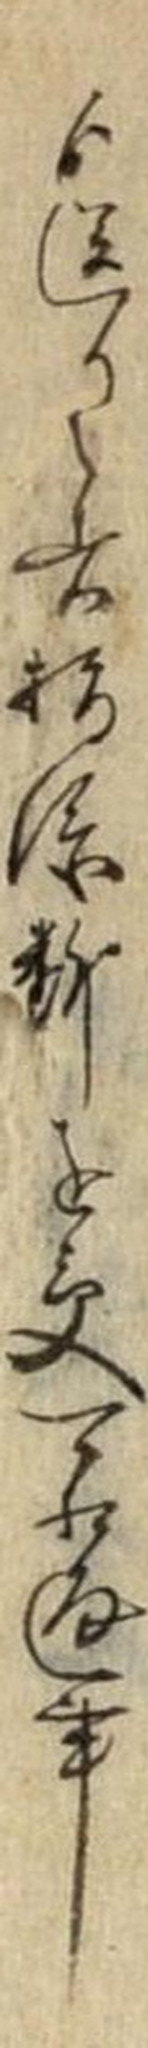ゟ送り之者点し指添断を受可相通事
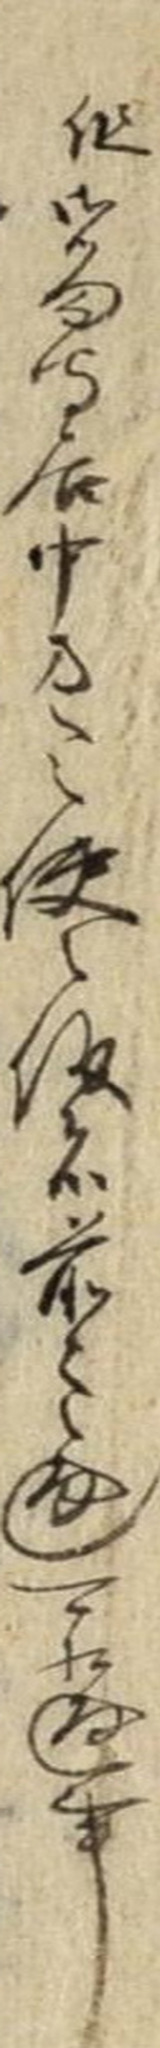但御留守居中方へ之使之儀は前々之通可相通事
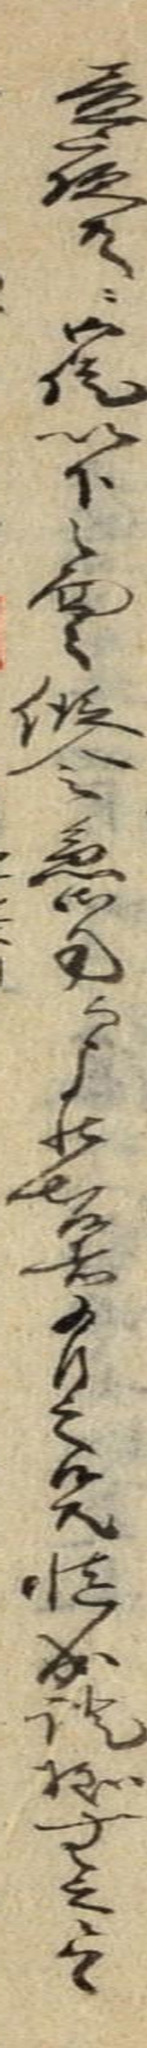一昼夜共に御徒以下之面々仮令急御用と申罷出候者有之候共慥成證拠無之候はゝ
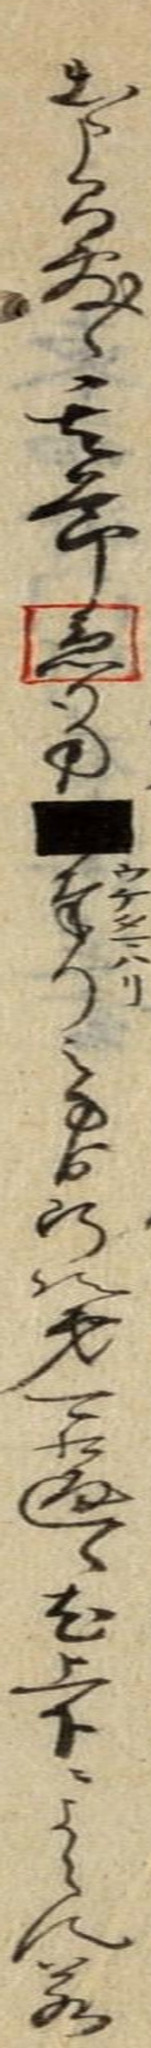出申間敷候其節急御用奉り之方ゟ断次第可相通候尤上下によらす若
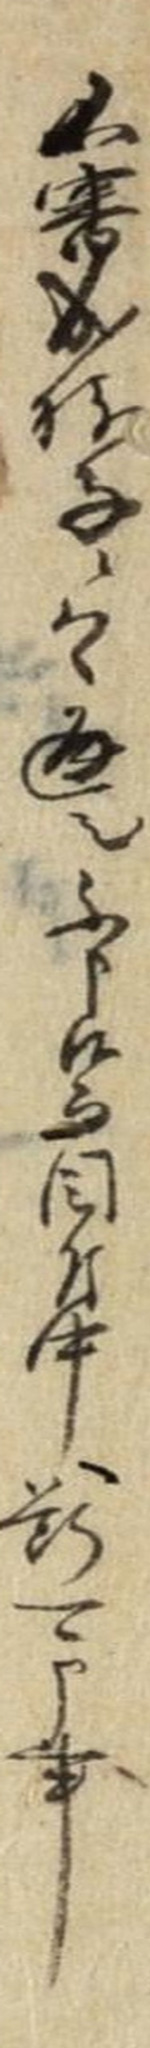不審成様子候はゝ通し不申候て目付中へ断可申事
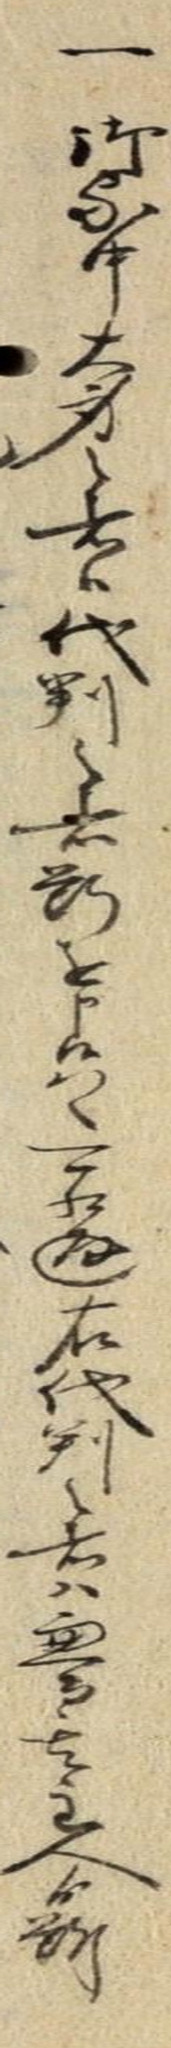一御家中大身之者は代判之者断を申候はゝ可相通右代判之者は兼て其主人ゟ断
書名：三都并道中之部
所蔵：福井県文書館 Fukui Prefectural Archives
